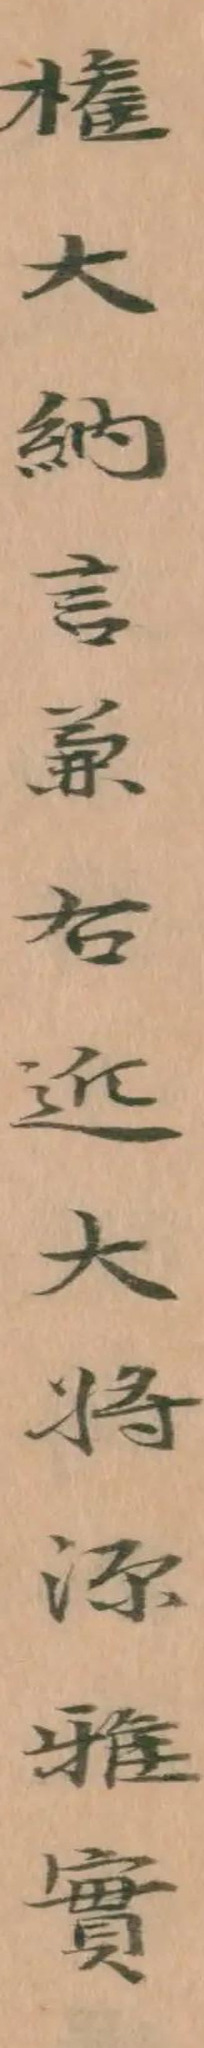権大納言兼右近大将源雅実
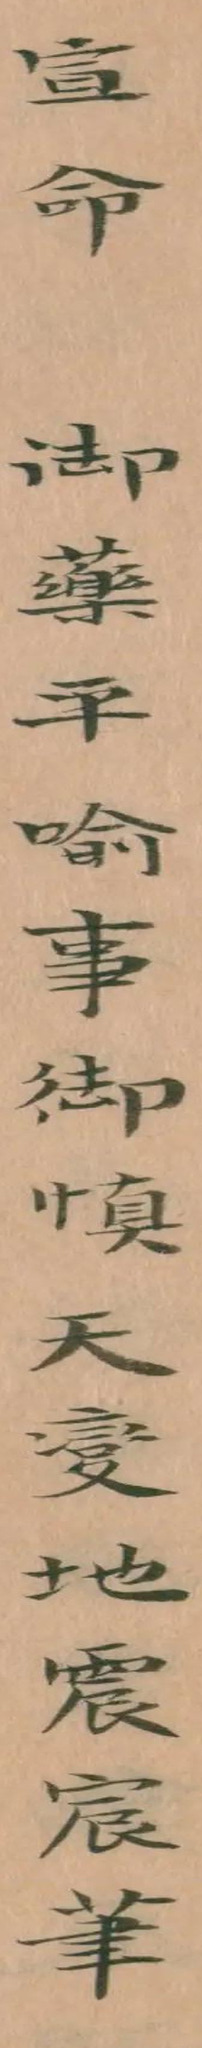宣命御薬平喩事御慎天変地震宸筆
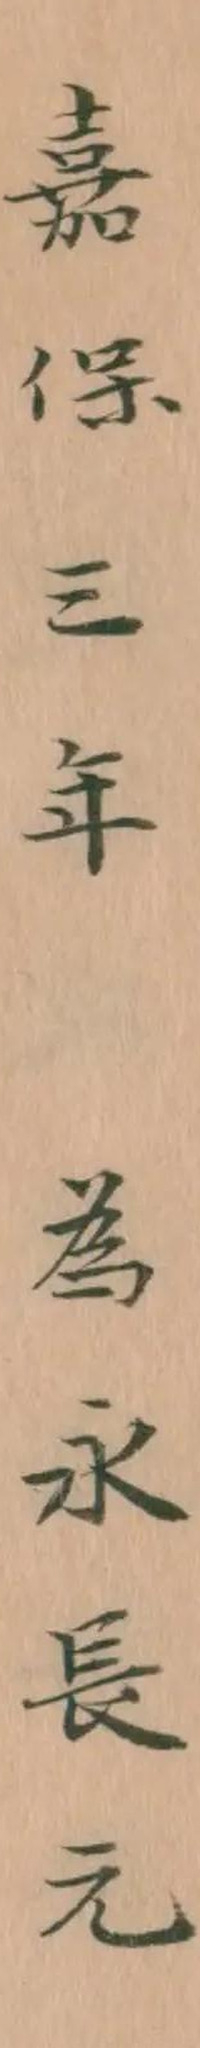嘉保三年為永長元
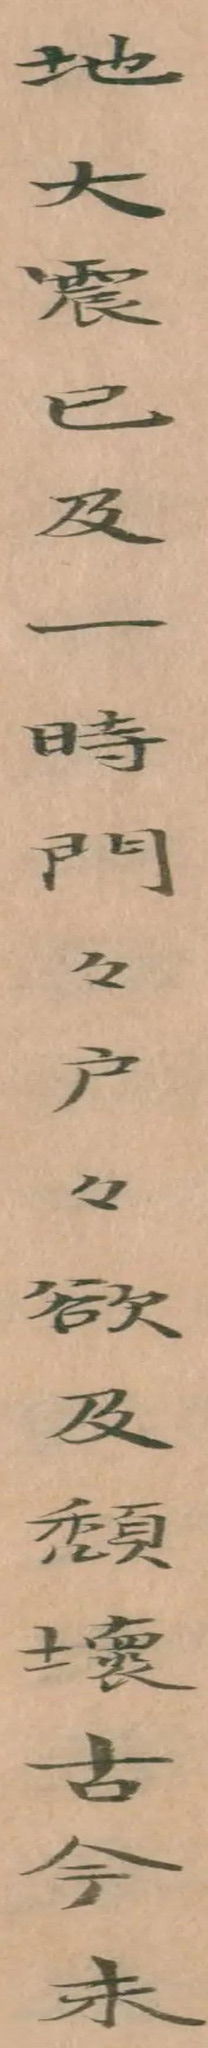地大震巳及一時門々戸々欲及頽壊古今未
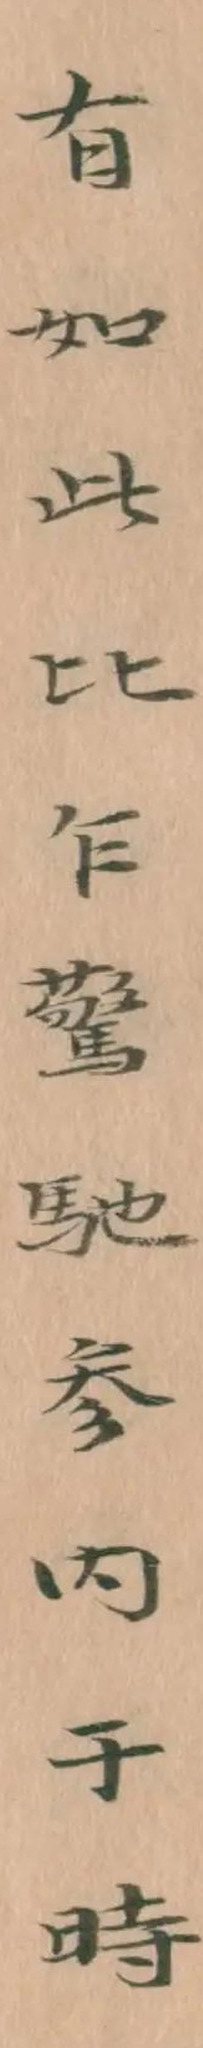有如此比乍驚馳参内于時
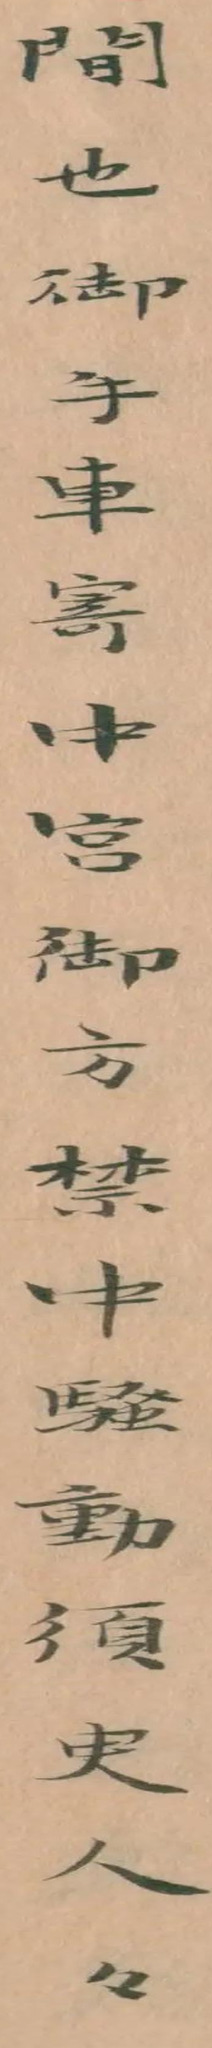間也御手車寄中宮御方禁中騒動須臾人々

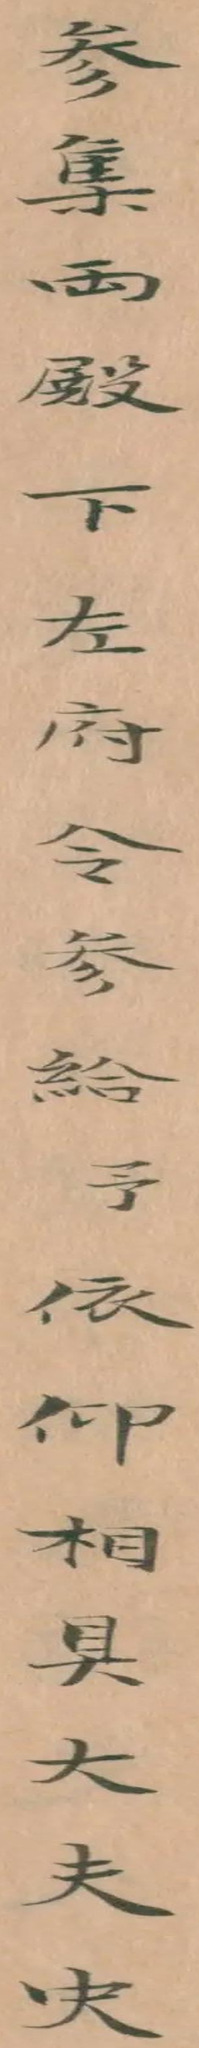参集両殿下左府令参給予依仰相其大夫史
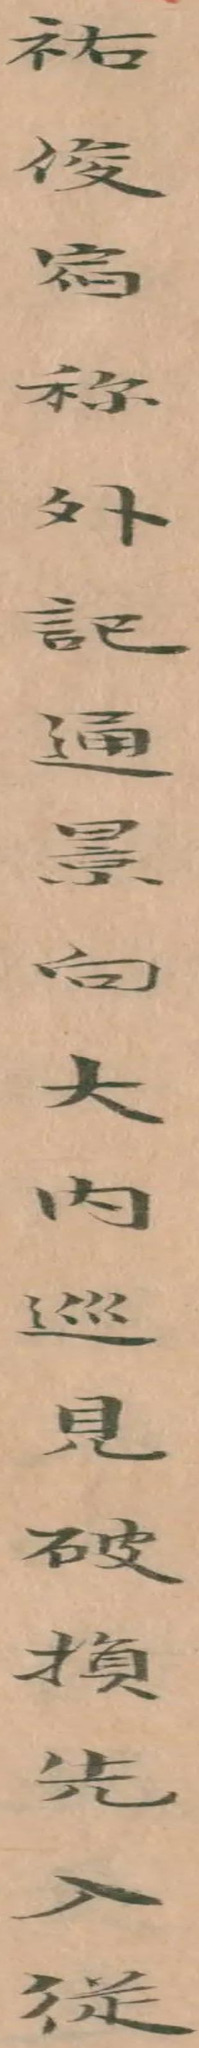祐俊宿祢外記通景向大内巡見破損先入従
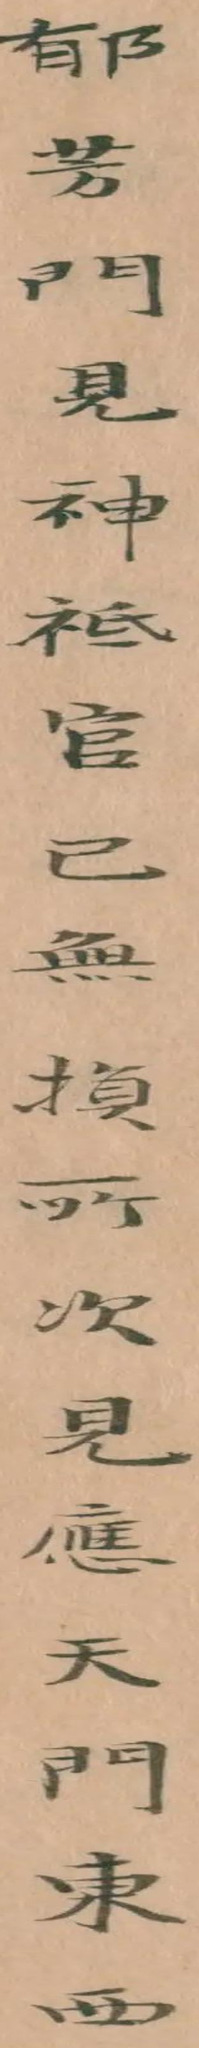郁芳門見神祗官已無損所次見応天門東西
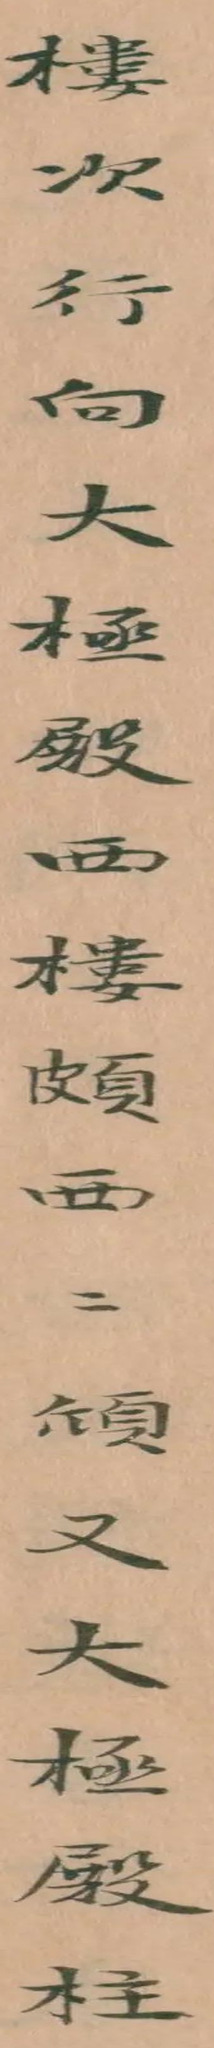楼次行向大極殿西楼頗西ニ傾又大極殿柱
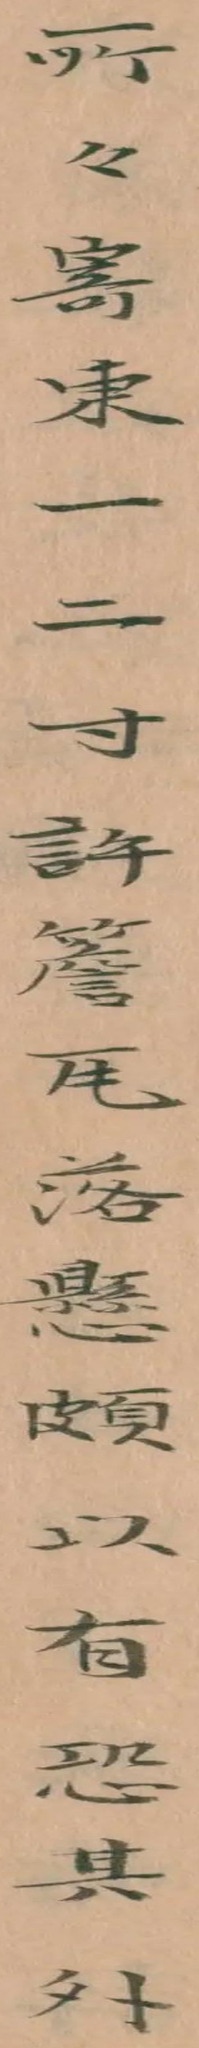所々寄東一二寸許簷瓦落懸頗以有恐其外
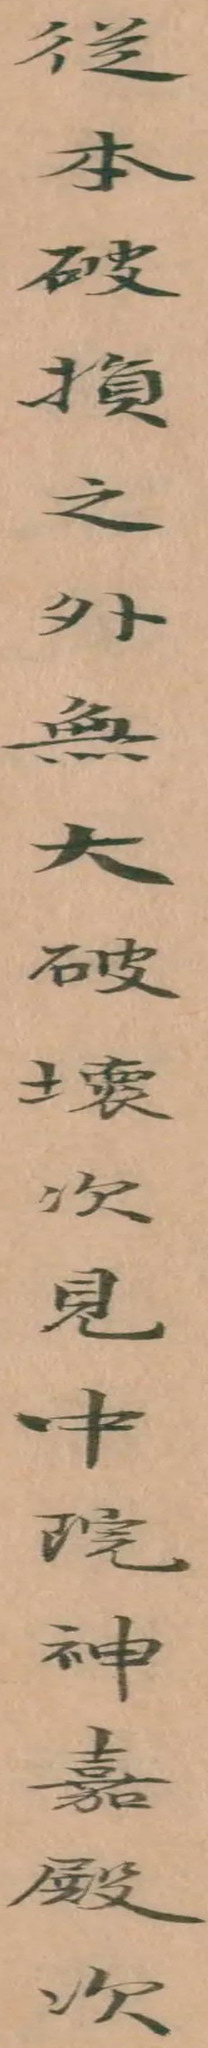従本破損之外無大破壊次見中院神嘉殿次
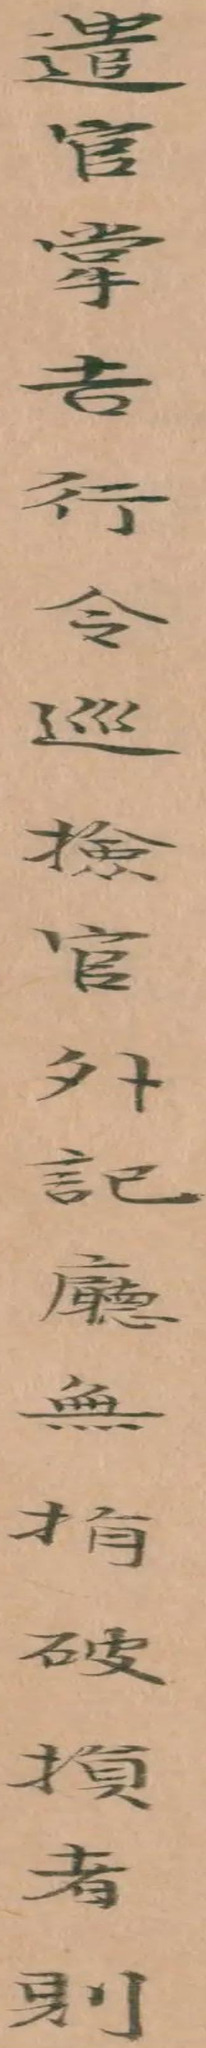遣官掌𠮷行令巡検官外記庁無捐破損者則
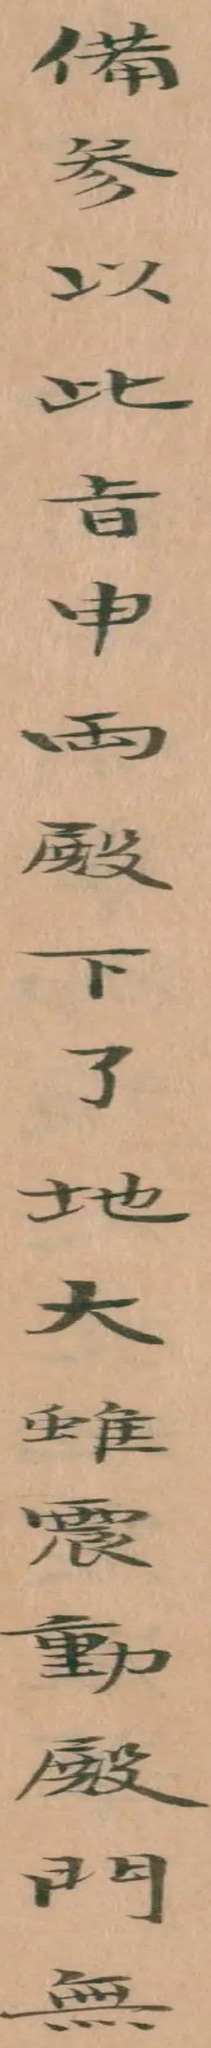備参以此旨申両殿下了地大雖震動殿門無
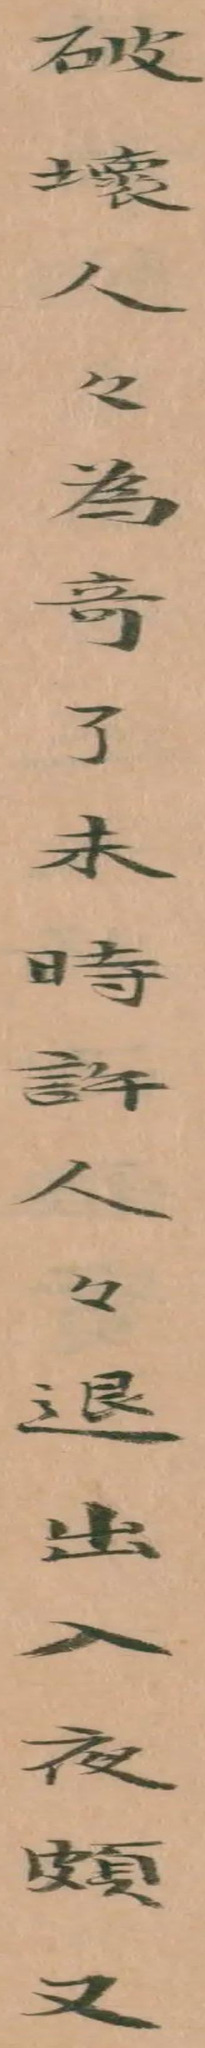破壊人々為奇了未時許人々退出入夜頗又
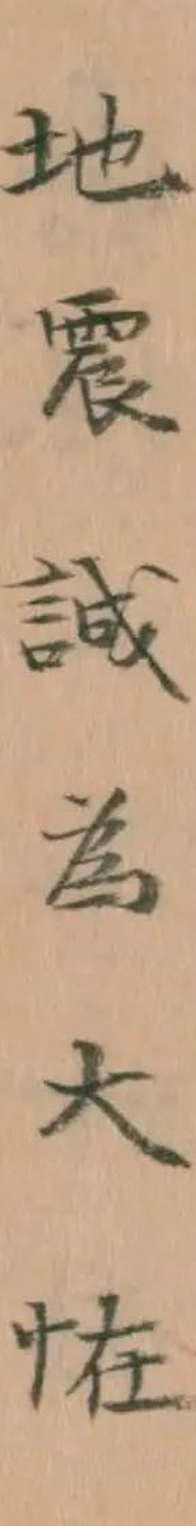地震誠為大恠
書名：地災撮要. 巻5-6(地震之部)
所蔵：国立国会図書館 National Diet Library, JAPAN
